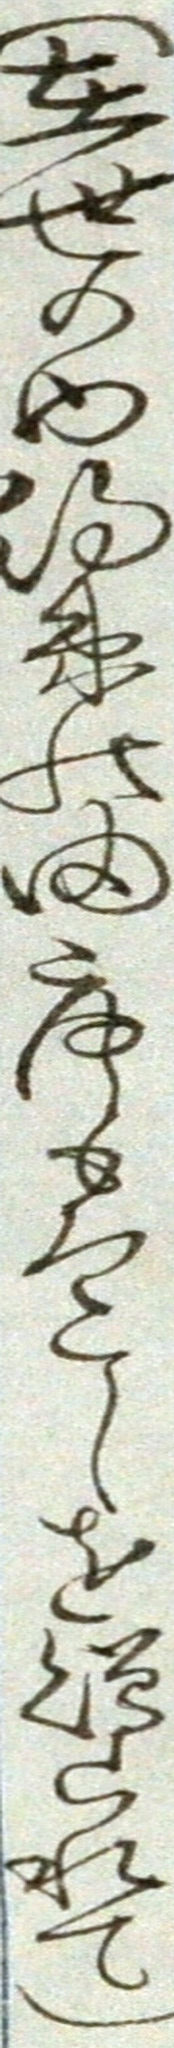₍在世の内約束能由唐もろこしを贈られて）
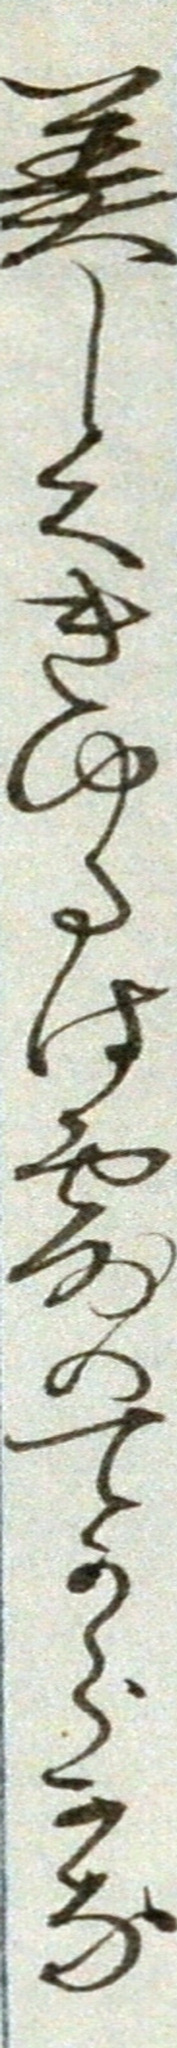美しくきゆるは雰のてがら可奈
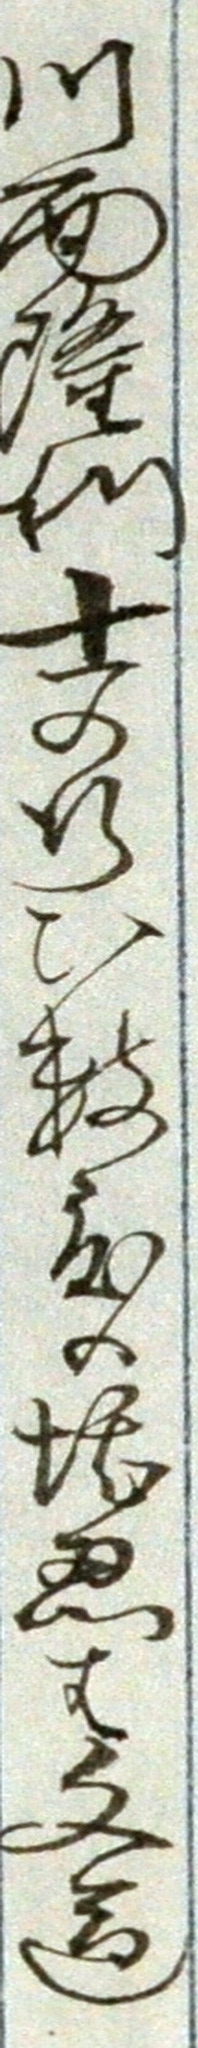川面隆利士の行ひ数度の堪忍者文道
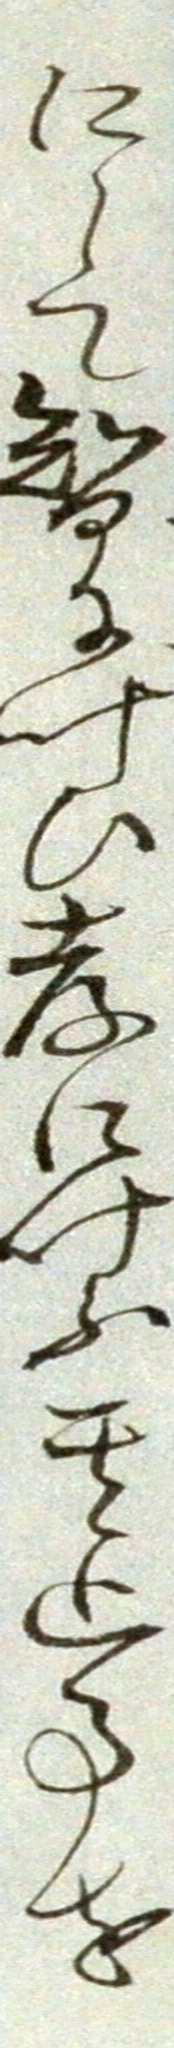にして智尓叶ひ孝に叶ふ其止事を
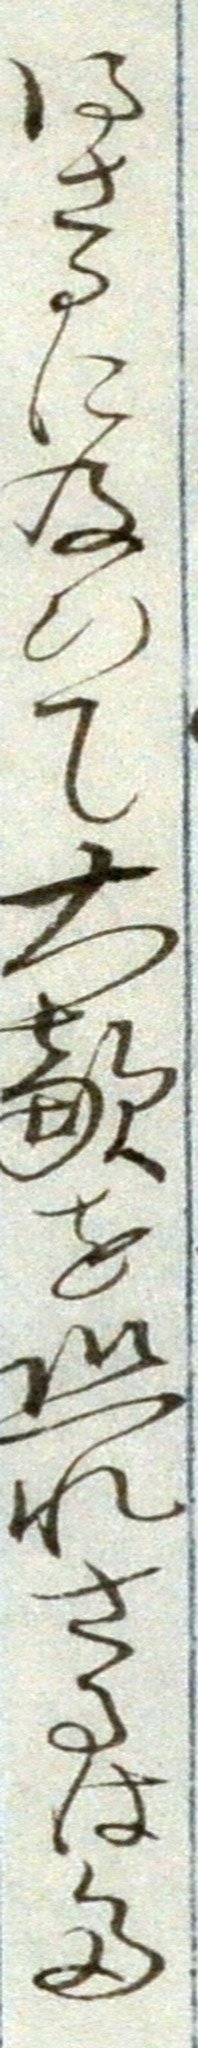満たさるに及ひ大敵を恐れさるは多
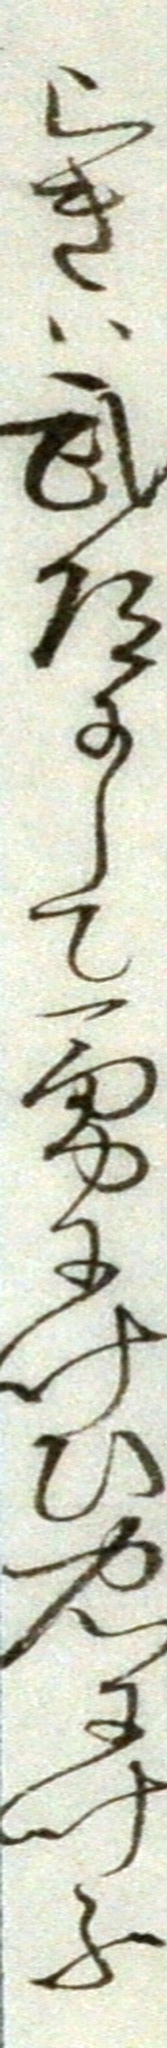らきㇵ武道尓して勇尓叶ひ忠尓叶ふ
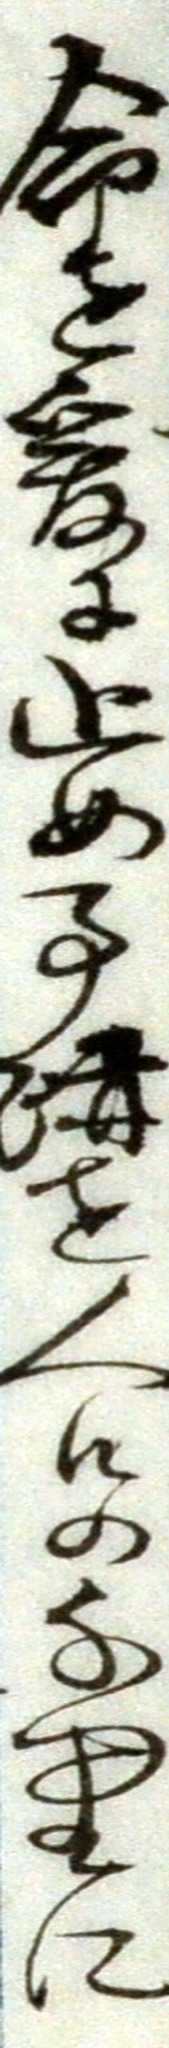命を爰漢字尓止め事跡を人口千里に
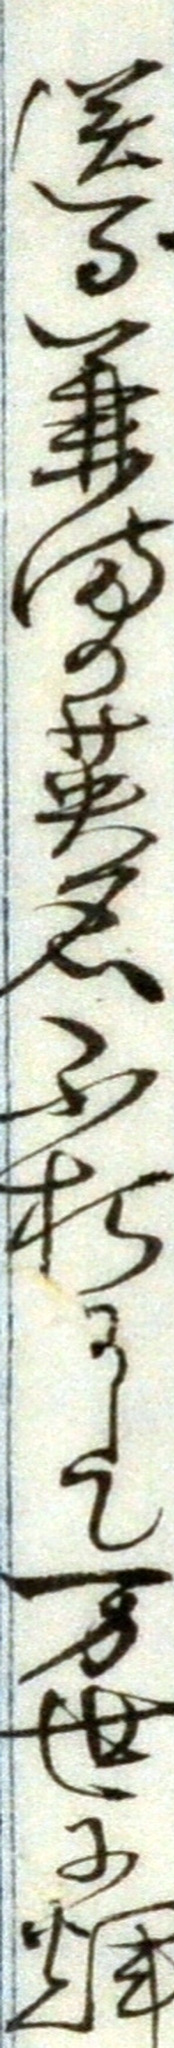送る兼備の英名不朽尓して万世尓輝
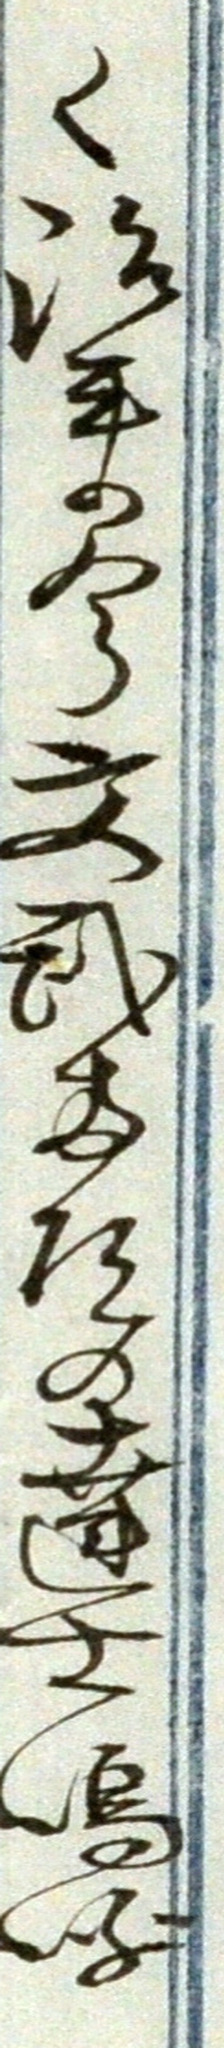く治平の今文武両道の達士嗚呼
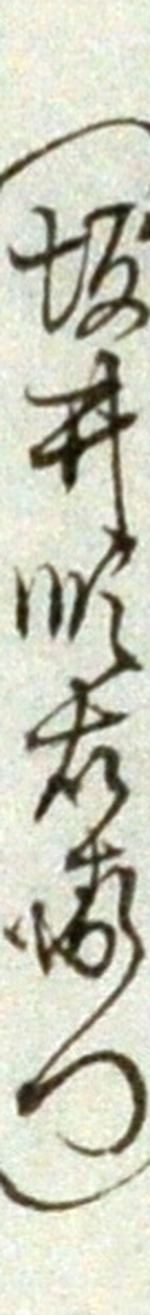₍坂井順右衛門)
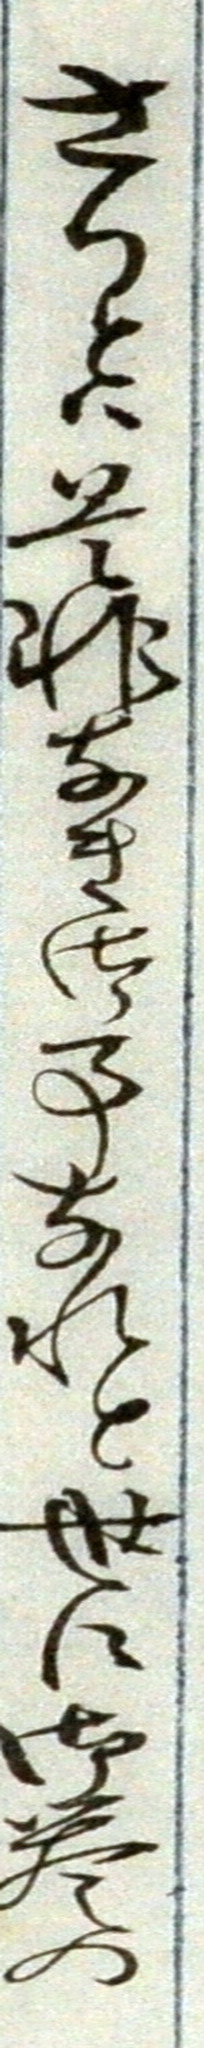さりとㇵ是非なき御事なれと世に御暮の
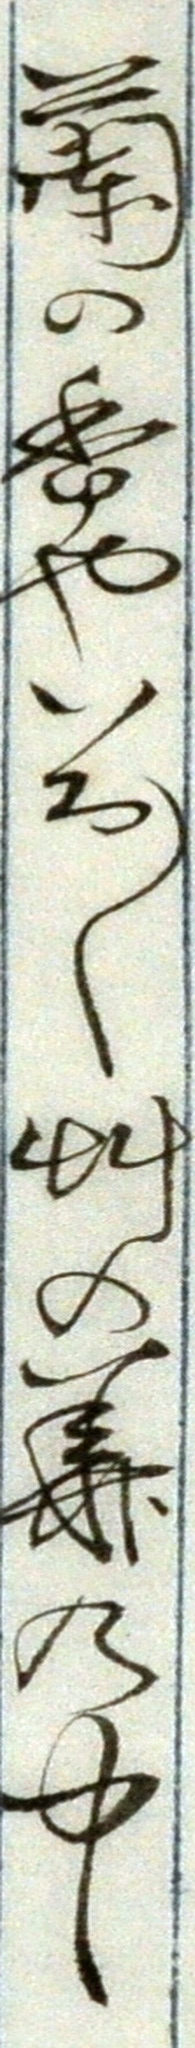蘭の香やいろいろ艸の華乃中
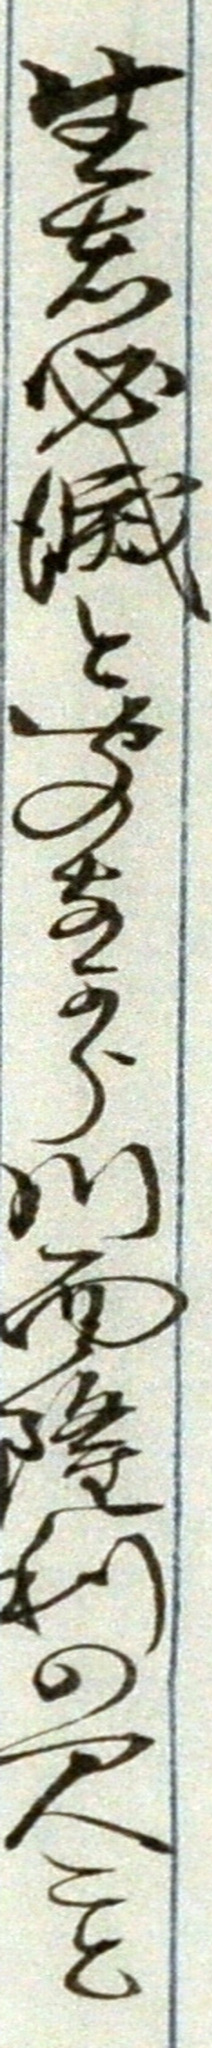生者必滅と聞な可ら川面隆利の尺こと
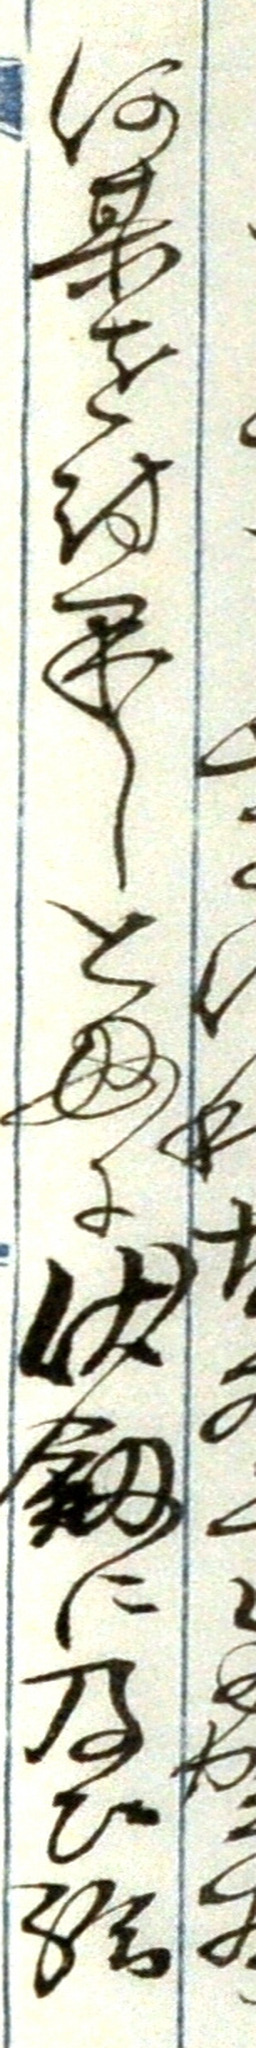何某を討果しと母漢字尓伏剣及ひ給

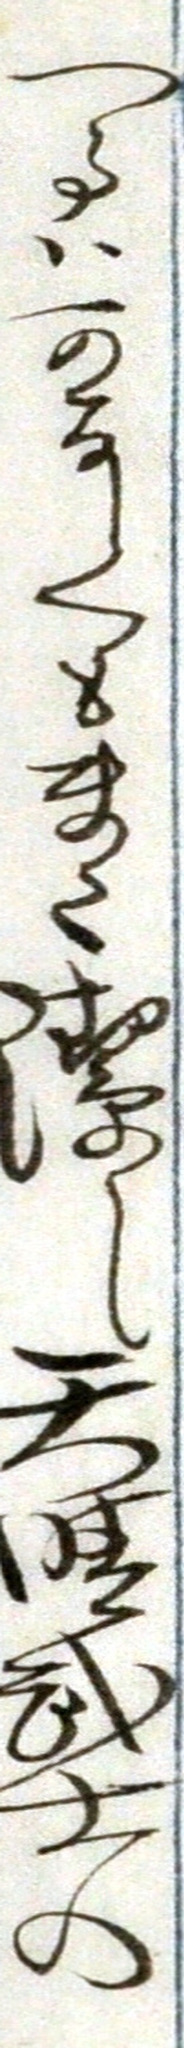つるㇵ可なしくもまた潔し天晴武士の
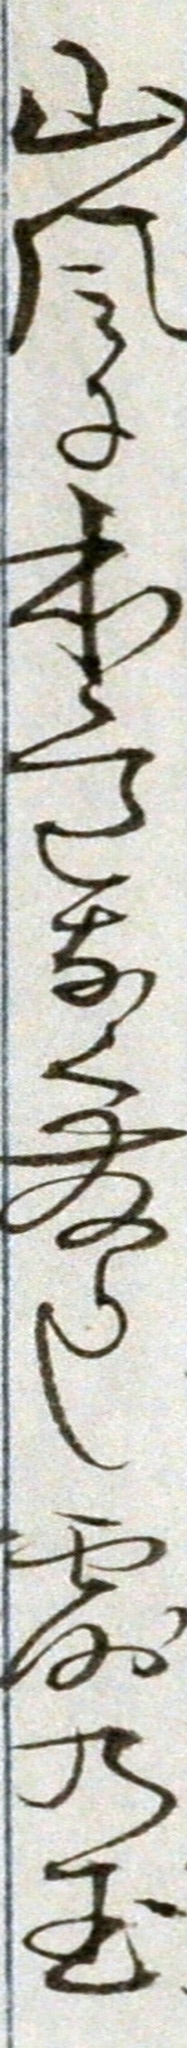山風尓本意なく散りし雰乃玉
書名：川面小藤太子細有之多賀谷唯右衛門ヲ打果候一件
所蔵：伊那市立高遠町図書館・合同会社AMANE
